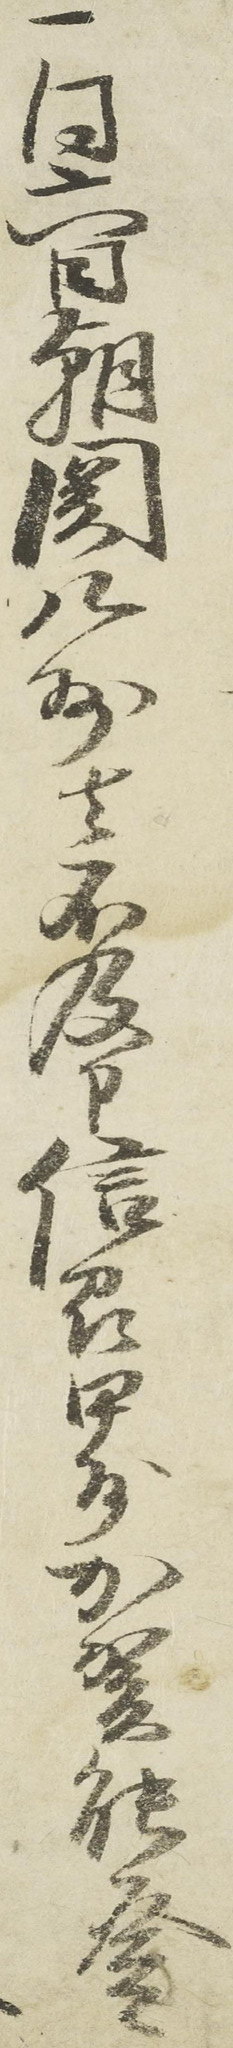一同六日朝関八州は不及申信州甲州加賀能登
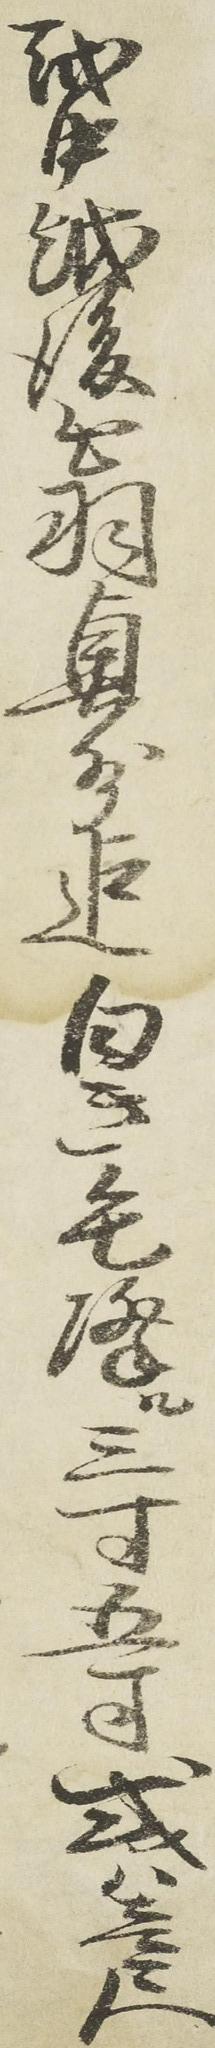越中越後出羽奥州迄白き毛降ル三寸五寸或ハ壱尺
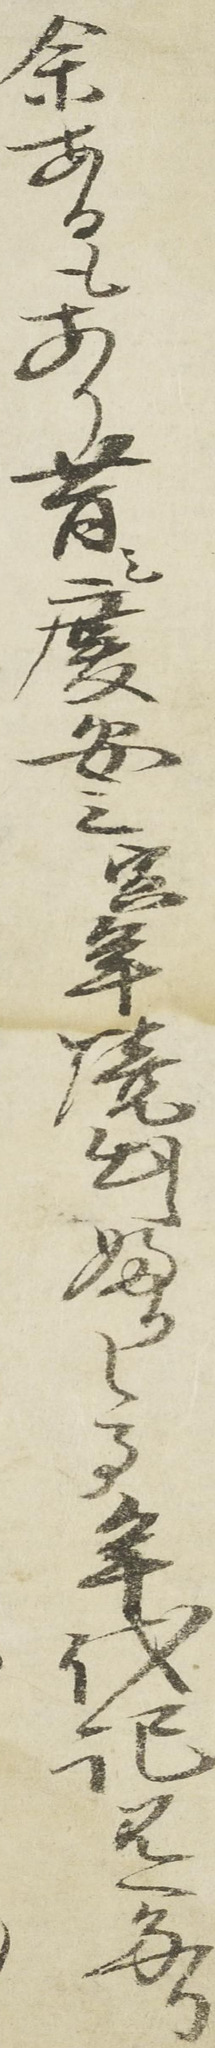余あるもあり昔シ慶安三寅年焼出しふりし事年代記見へたり
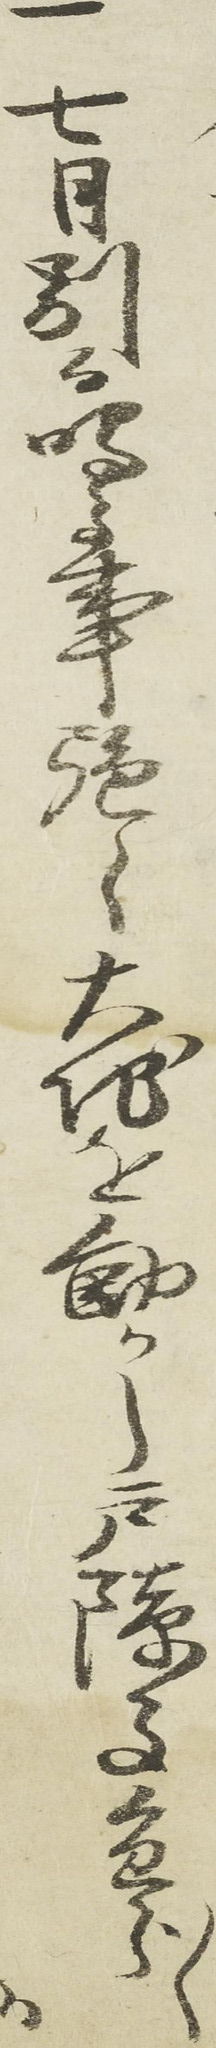一七月別而鳴る事強く大地を動かし戸障子くら〳〵
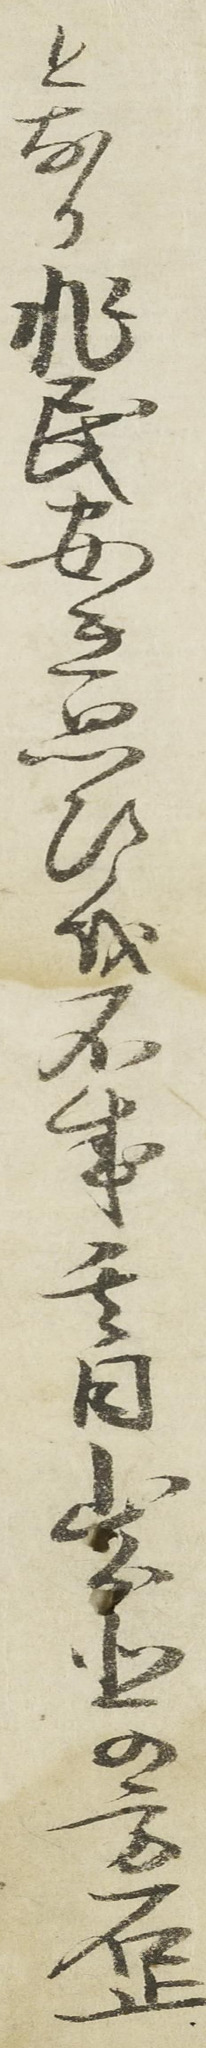となり兆民安き思ひを不成其日山ゟ直の方石止る
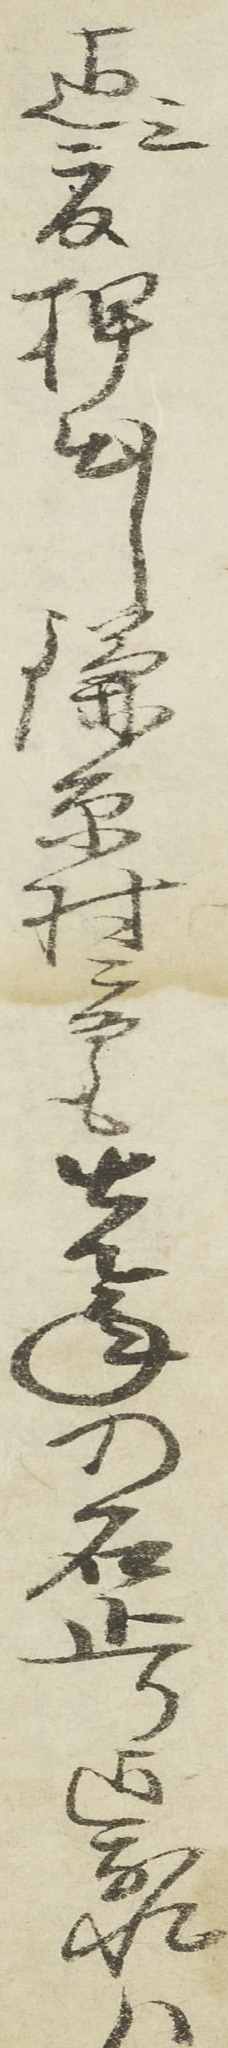迄三度押出し鎌原村ニ而も先年の石止り迄なれハ
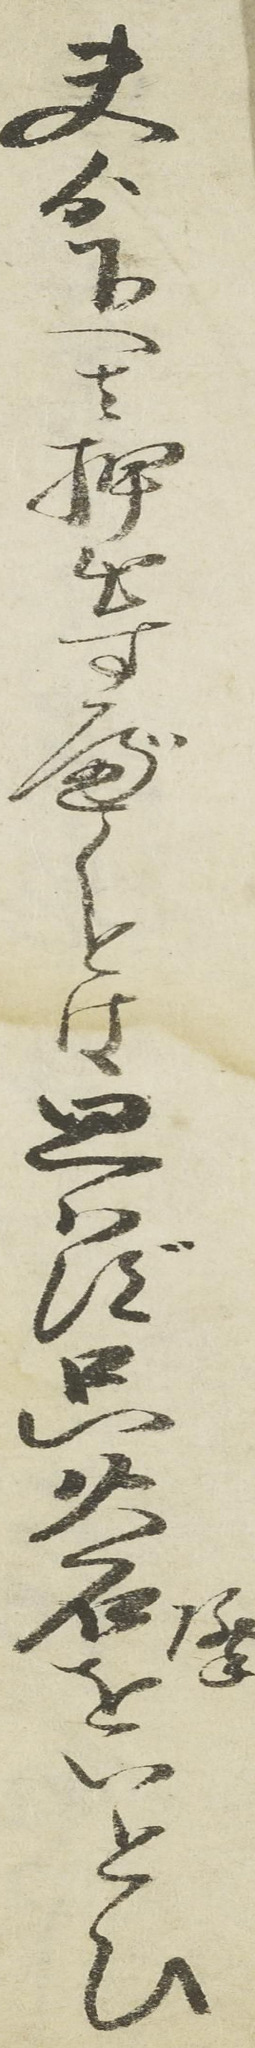夫ゟ下へは押出すべくとは思ハず只火石降をいとひ
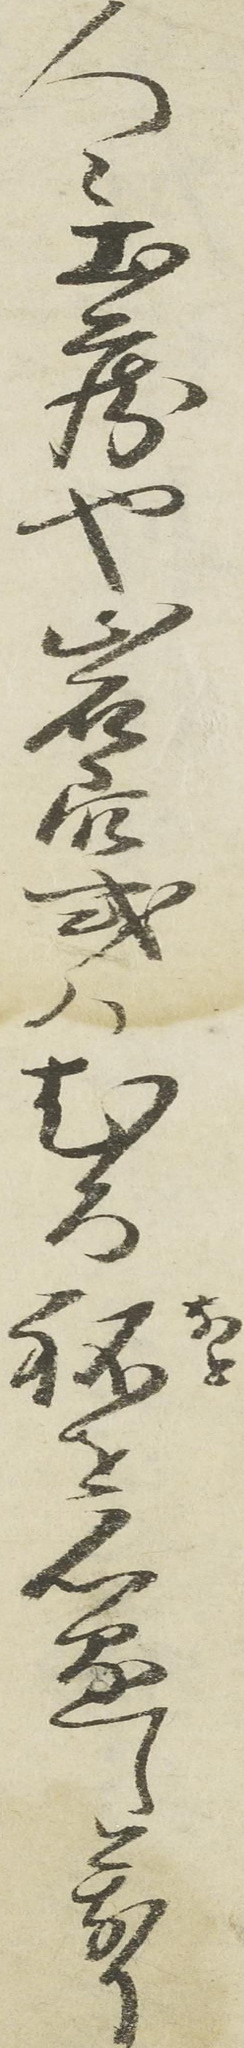人々土蔵や岩穴或ハむろ抔を心懸しとなり
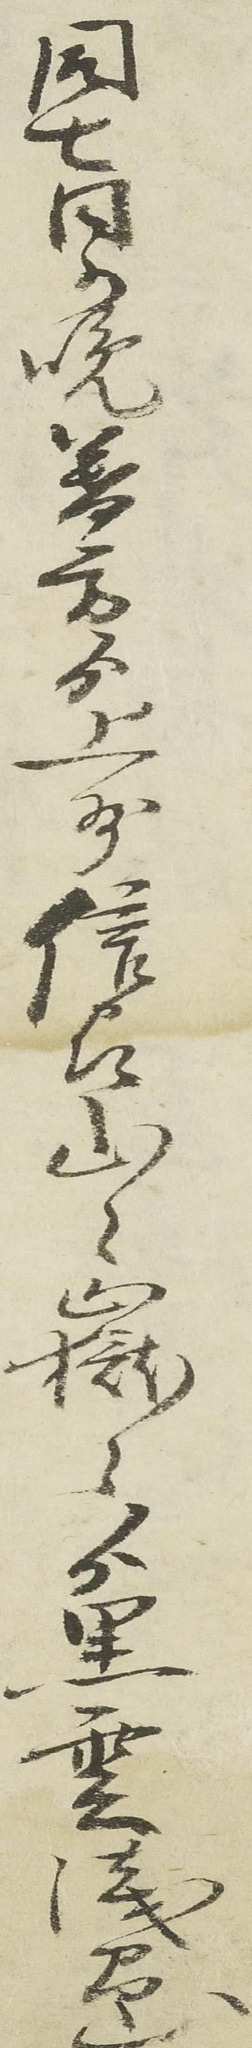同七日の晩暮方ゟ上州信州山々嶽々ゟ黒雲浅間山
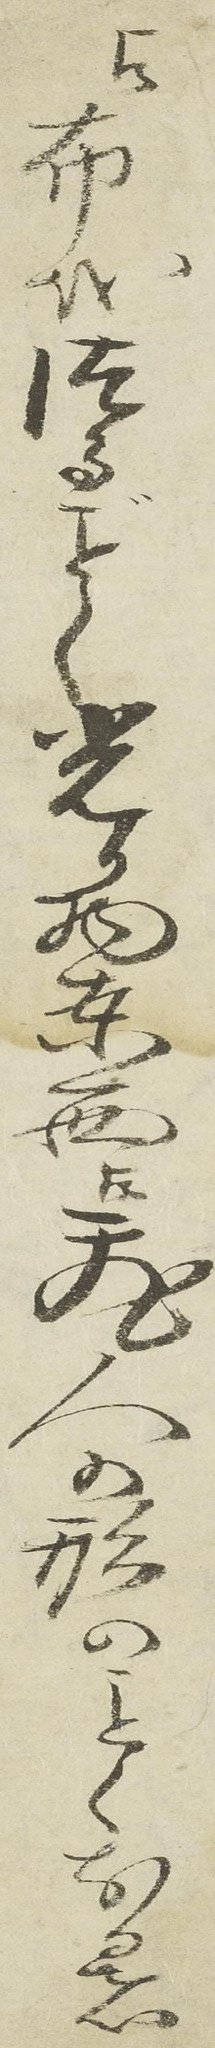え布をつるごとく光り物東西え飛人の形のことくなる者
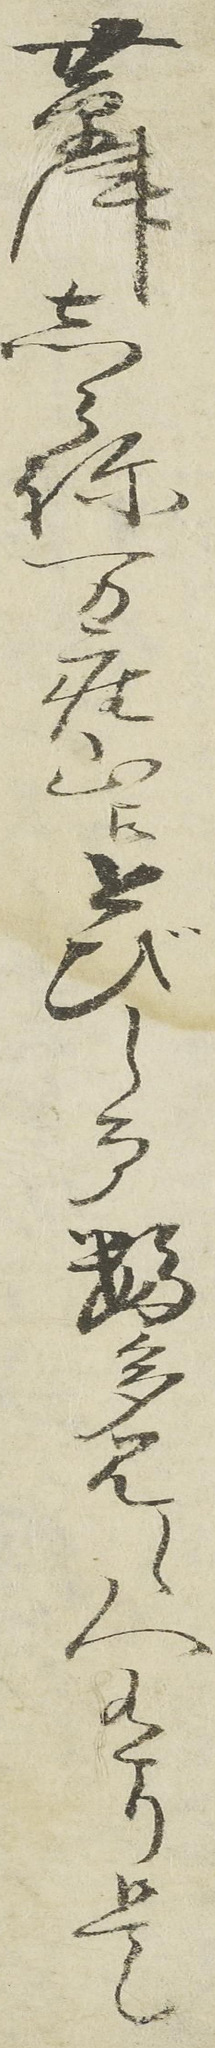草津しらね万座山えとびしる夥多見し人有り是
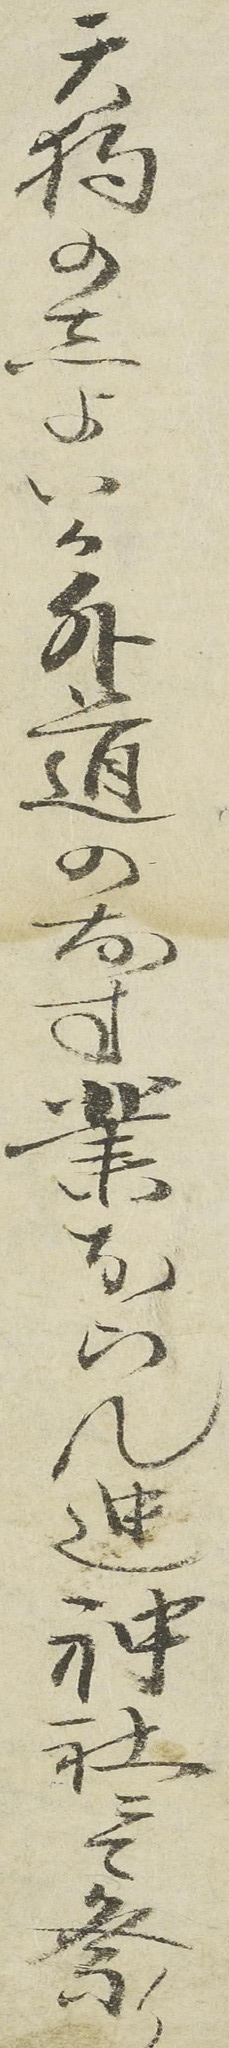天狗の志にいか外道のなす業ならん迚神社ニて祭り
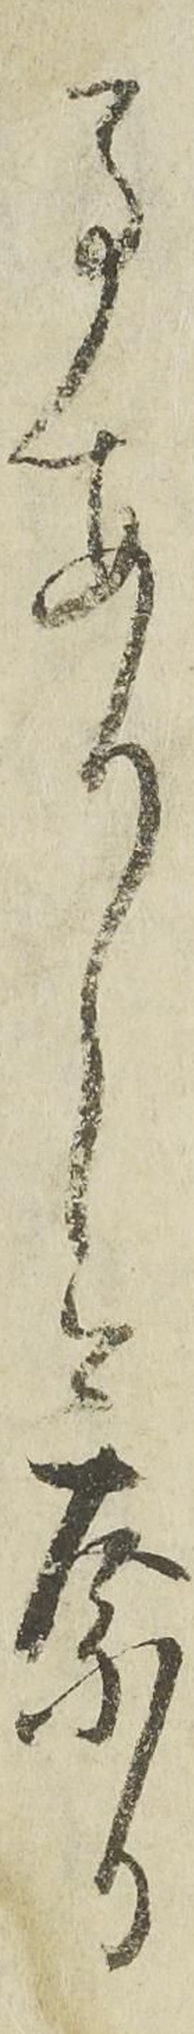事ありしとなり

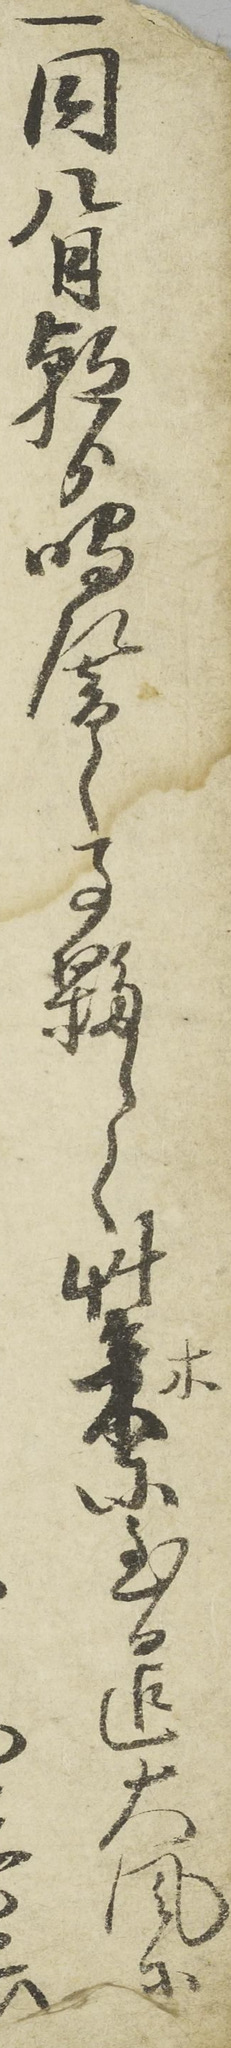一同八月朝ゟ鳴闇の事夥しく竹木に至る迄大風等
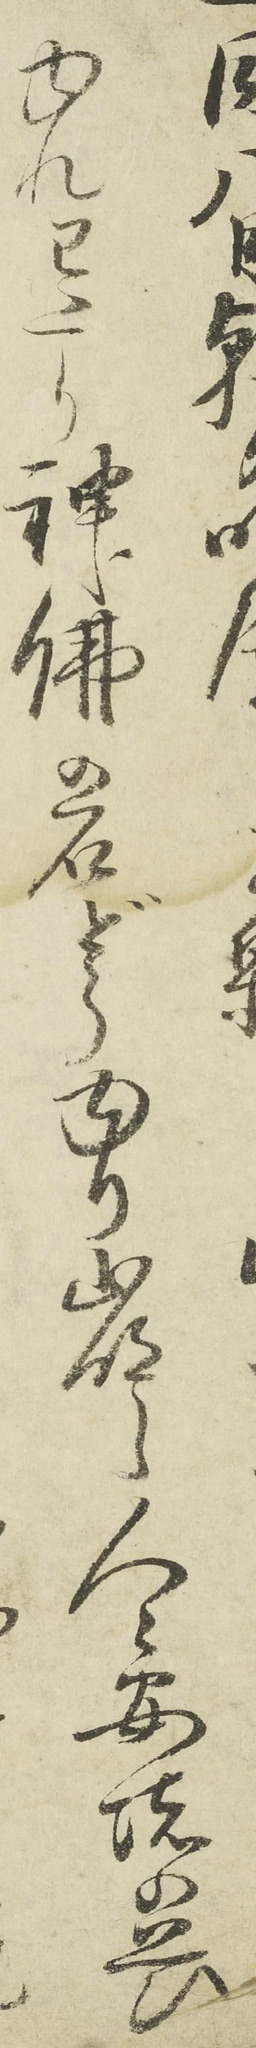ゆれわくり神仏の石どうゆり山鳴の人々安堵の思ひ
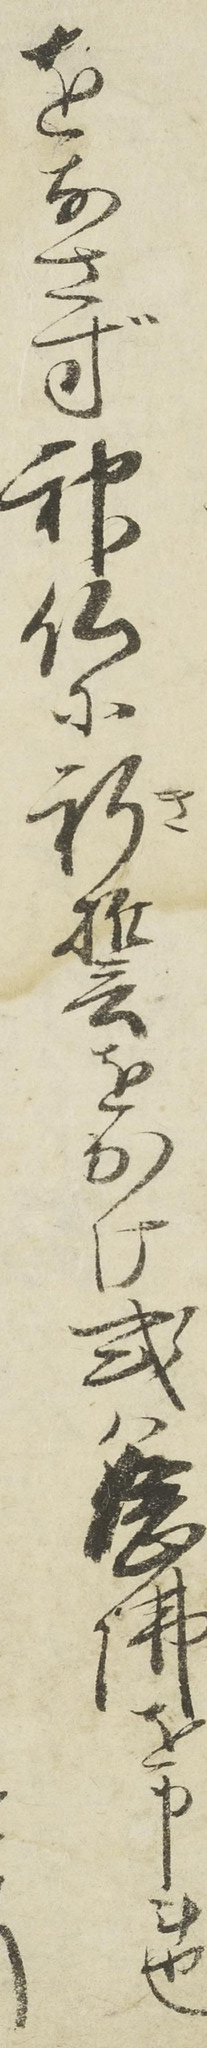をなさず神仏に祈誓をかけ或ハ念仏を申斗也
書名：浅間大変略記
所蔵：東京大学地震研究所図書室 Earthquake Research Institute Library, The University of Tokyo, JAPAN
